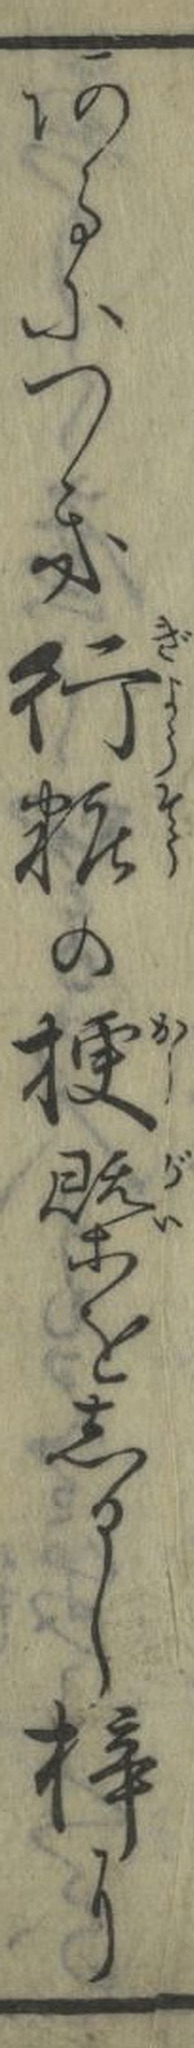あるにつき行粧の梗概をしるし梓に

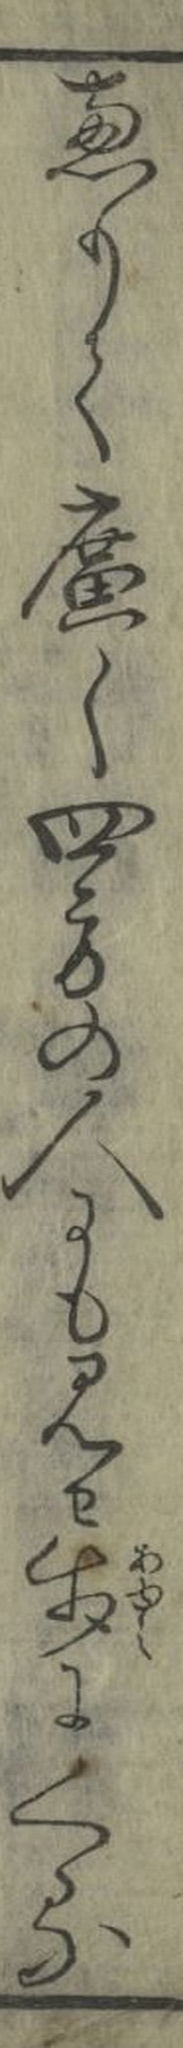ゑりて廣く四方の人にも見せ歩にくる
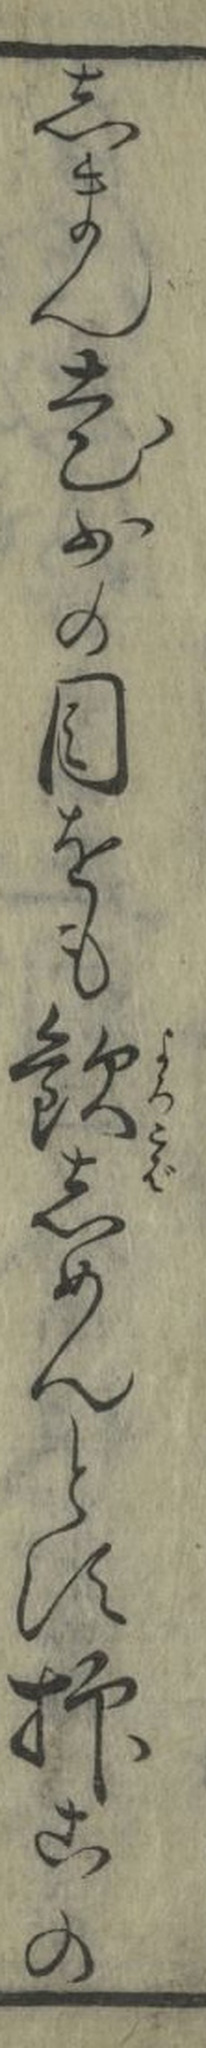しまん老少の目をも歓しめんとす抑この
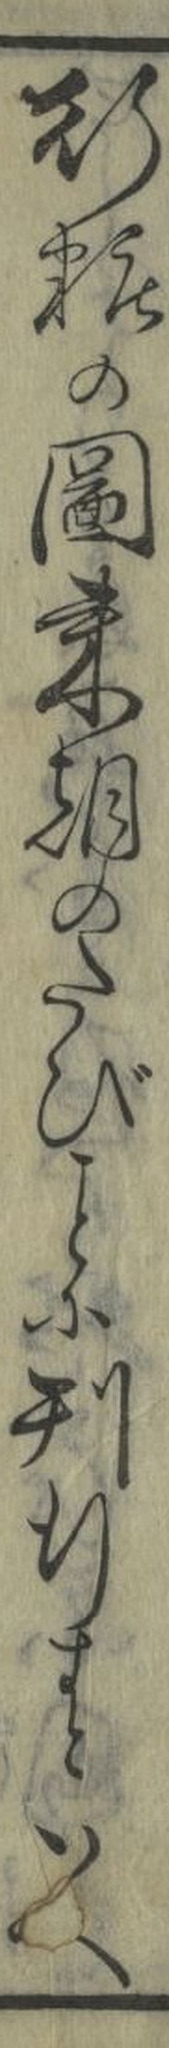行粧の圖来朝のたびことに刊行すといへ
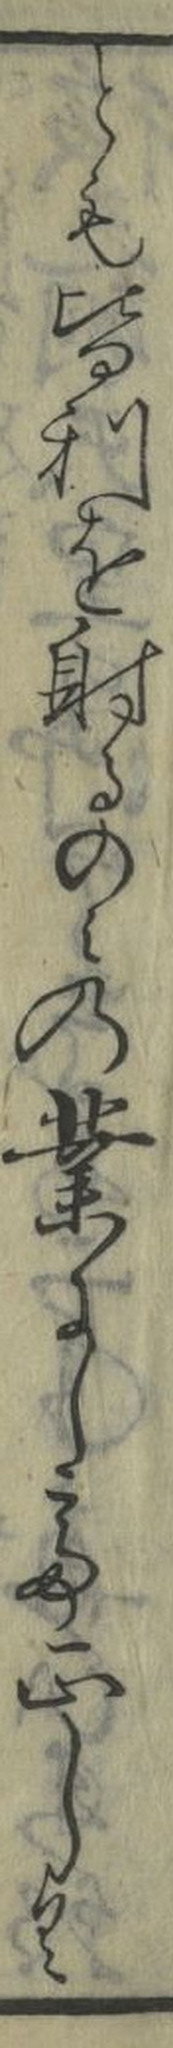とも皆利を射るのみの業にして正しく
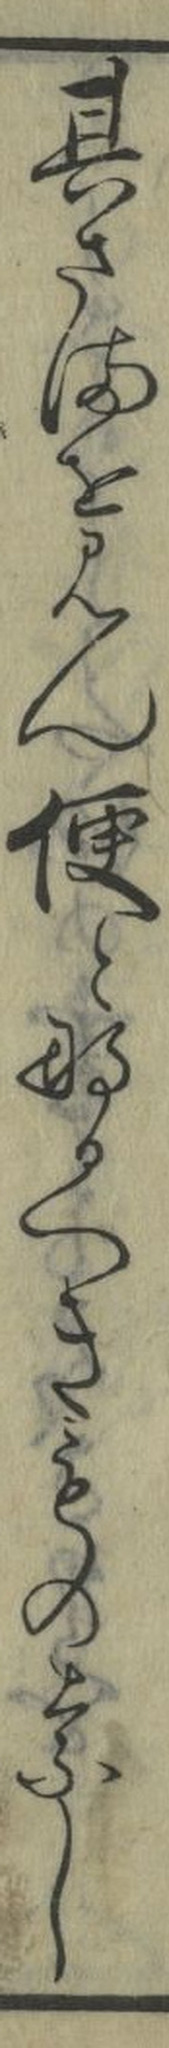其さまを見ん便となるへきものなく
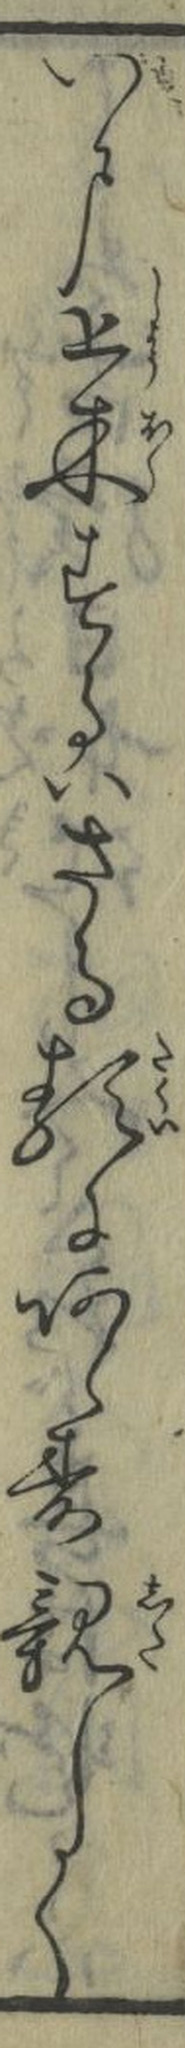いま上木するはさる類にあらす親しく
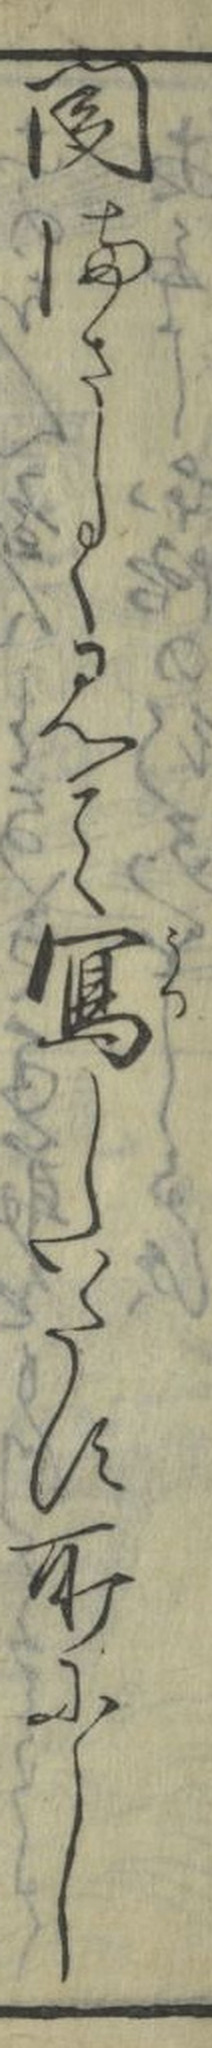聞まさしく見て寫しいたす所にし
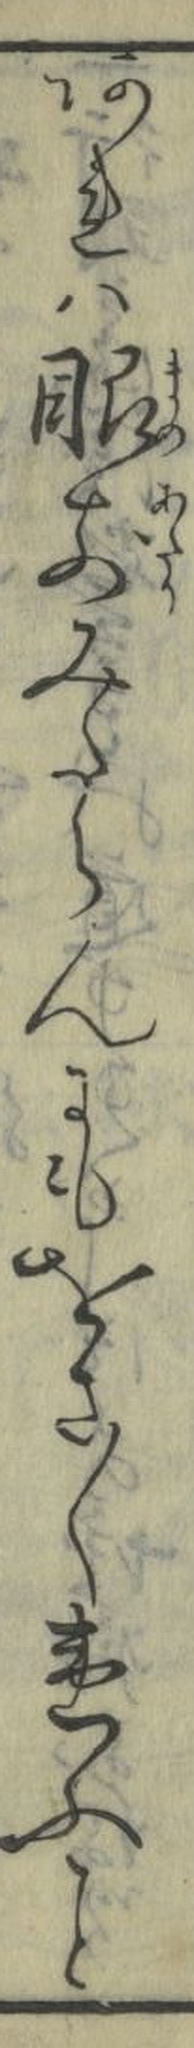あれは眼前みたらんにもをさ〳〵違ふこと
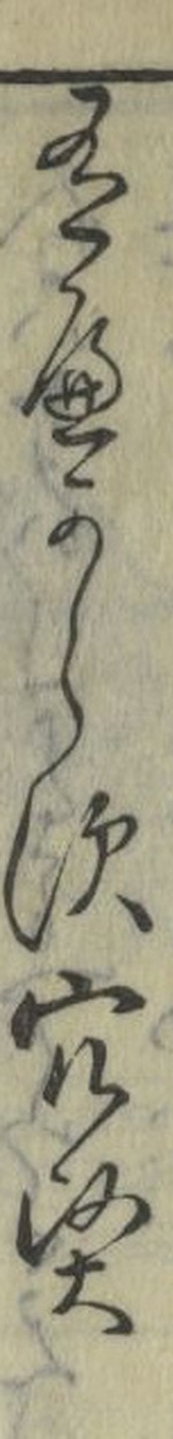有へからす穴賢
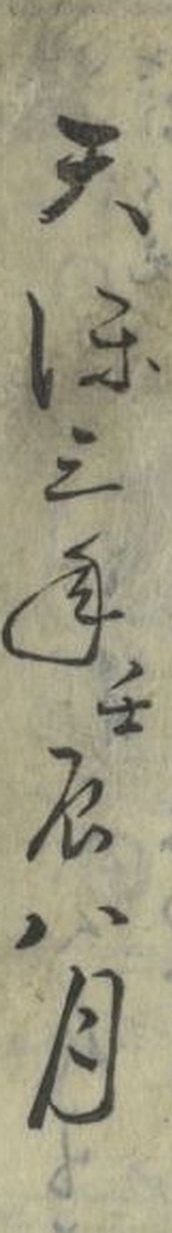天保三年壬辰八月
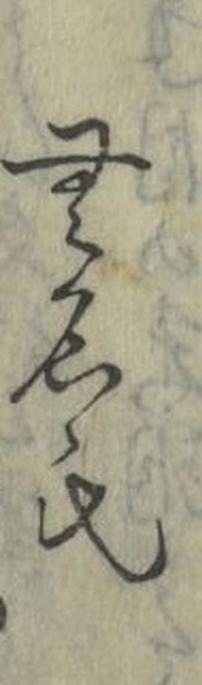無名氏
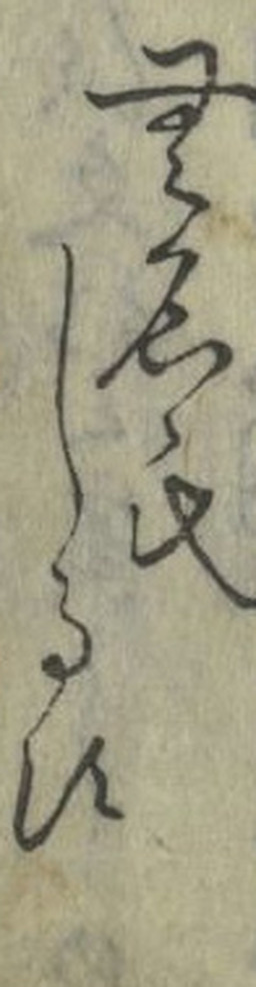しるす

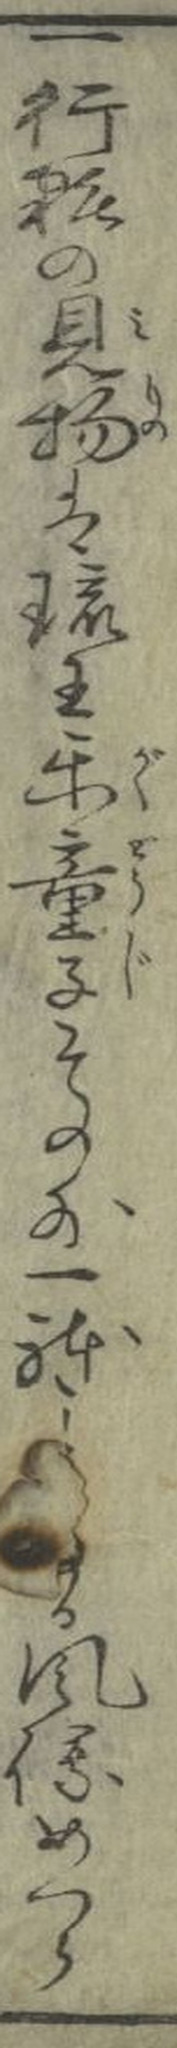一行粧の見物は琉王楽童子その外一躰ことなる風儀めつら
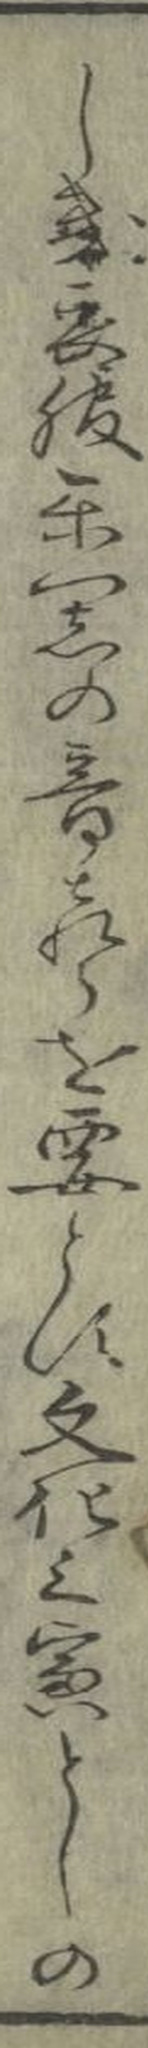しき衣服楽器の音声を要とす文化三寅としの
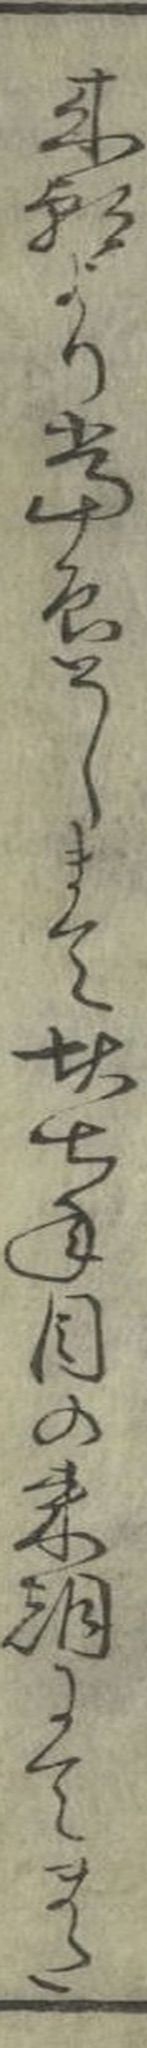来朝より当辰としまて廿七年目の来朝にてまた
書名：[琉球人行列記]
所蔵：University of the Ryukyus Library
